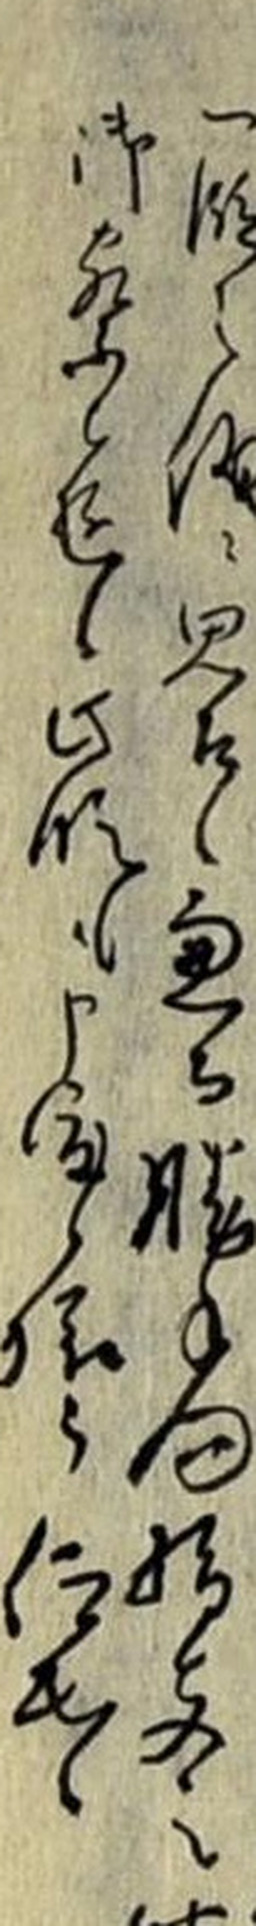御察被遊候此段も申渡候様被仰出候
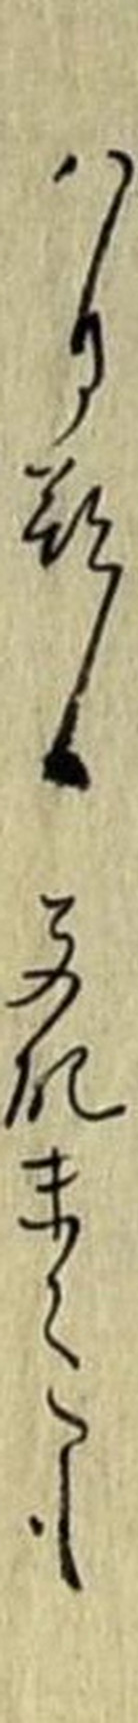八月朔日支配末々へも
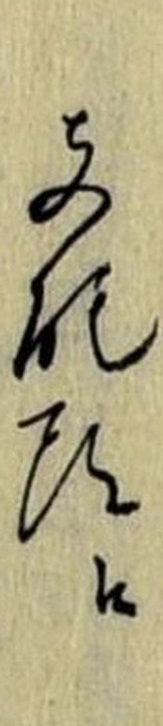支配頭え
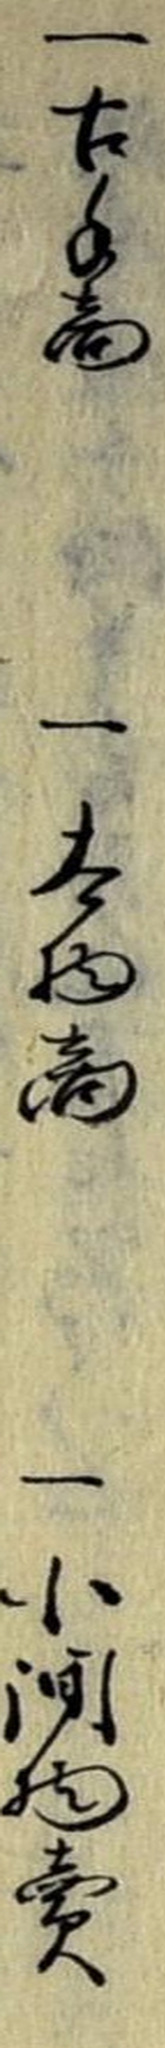一古手商一太物商一小間物売
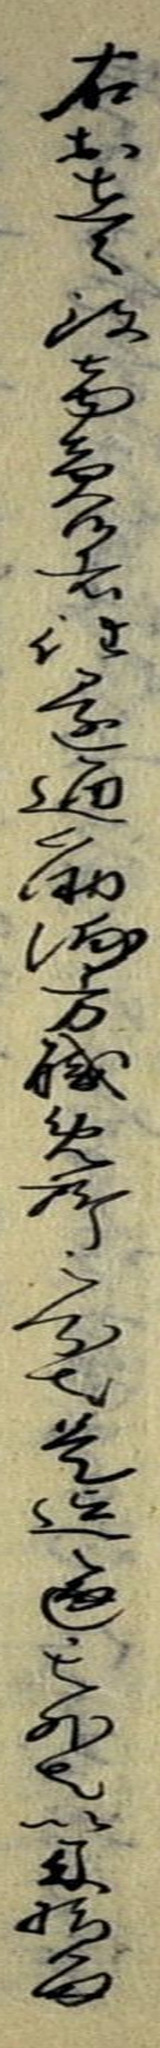右於在々致商売候者往還通筋浦方職免所之分は是迄之通其外は以来指留
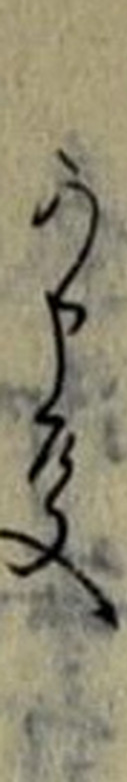可申事
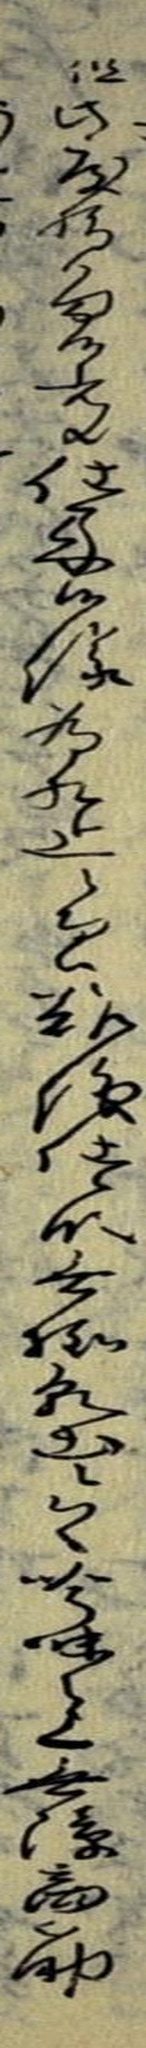但此度指留候者共仕来候儀為相止候而は難儀仕候段無拠願出候はゝ吟味之上無障商筋
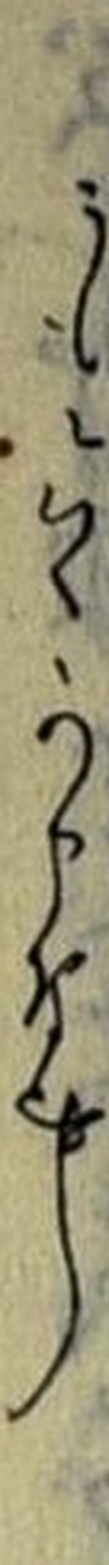にも候はゝ可申付事
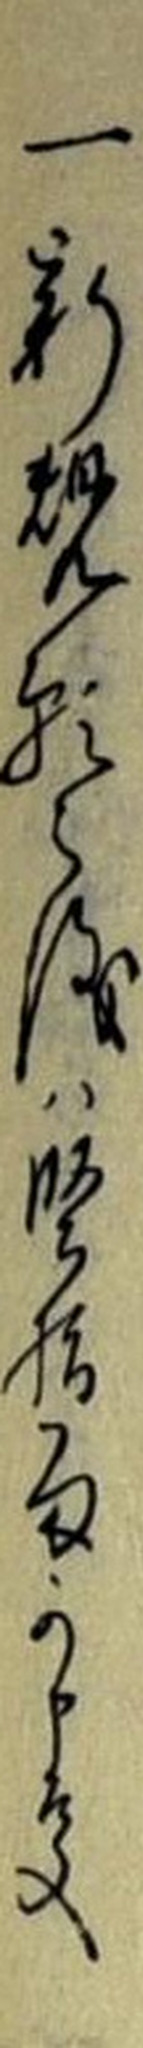一新規願之儀は堅指留可申事
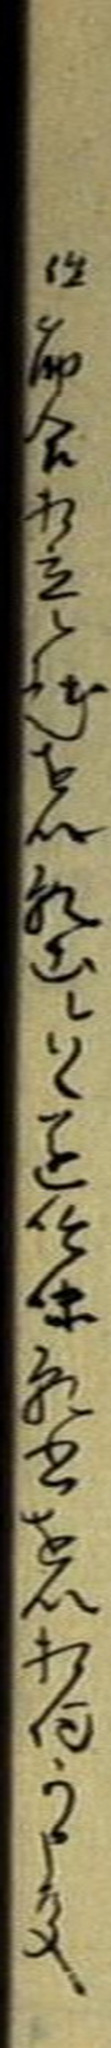但筋合相立候趣を以願出候はゝ遂吟味願書を以相伺可申事
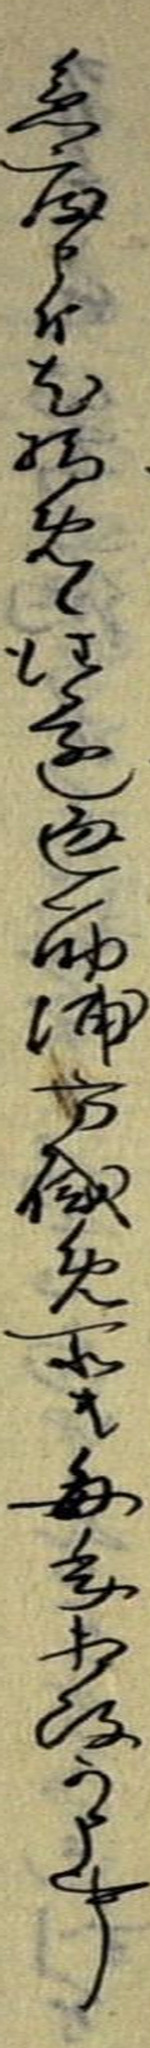急度申付尤指免候往還通筋浦方職免所共毎年相改可申事
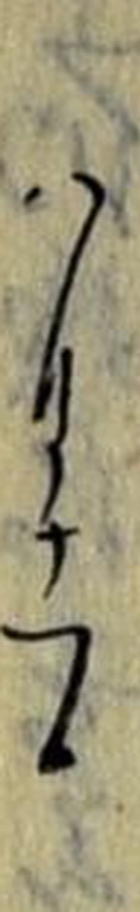八月十一日
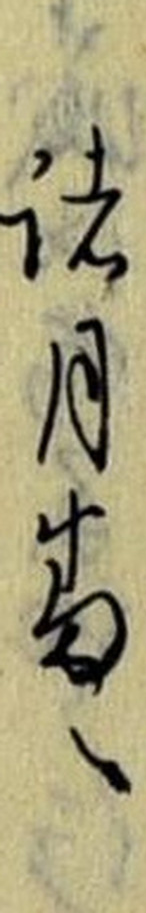諸月番へ
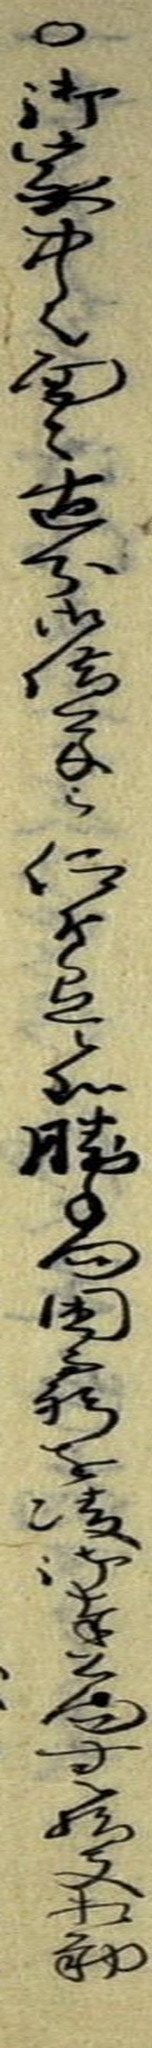〇御家中之面々過分御借米被仰付置候処勝手向困窮を凌御奉公向無指支相勤
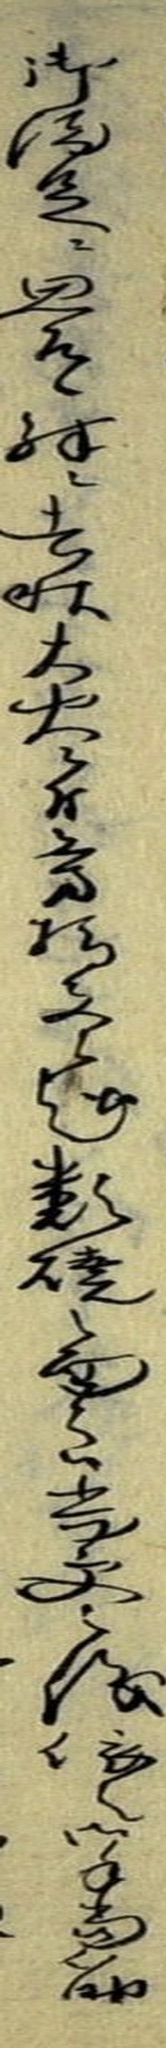御満足に思召候殊に去秋大火に付旁指支之趣類焼之面々は尚更之儀依之御手当筋
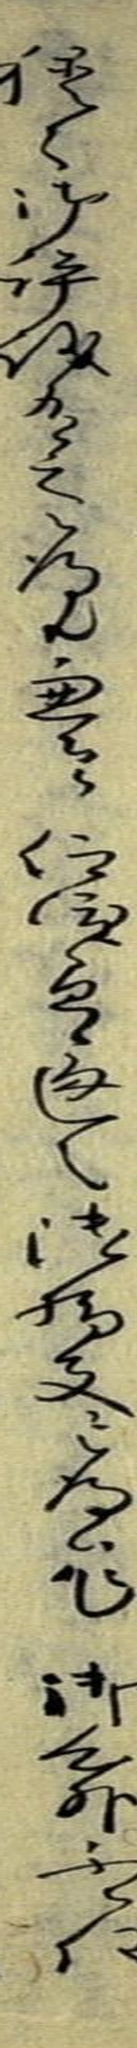種々御評儀有之候得共兼而被仰渡置候通之御指支に候得は乍御心外不被任
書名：命令之部 二
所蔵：福井県文書館 Fukui Prefectural Archives
